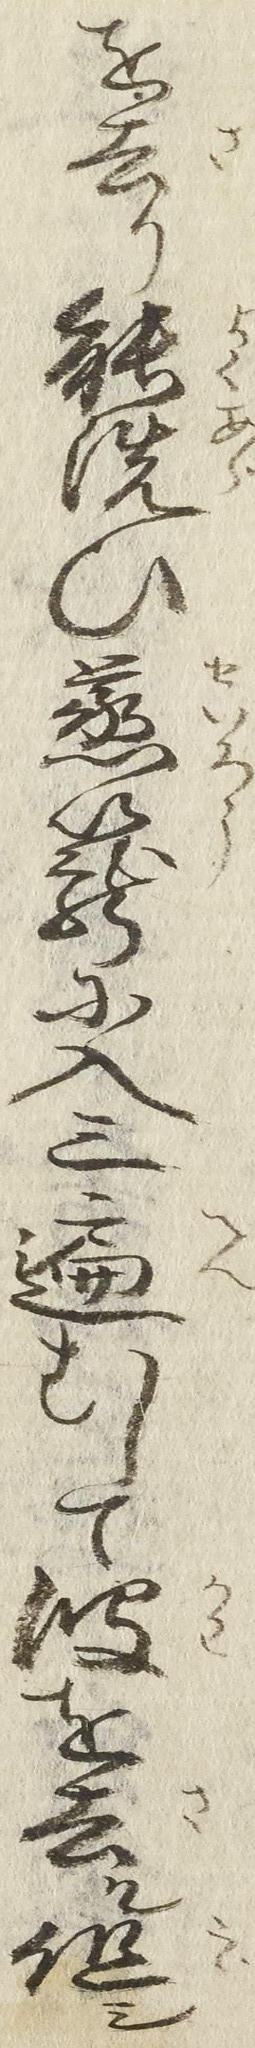を去り能洗ひ蒸籠に入三遍むして皮を去ル但シ
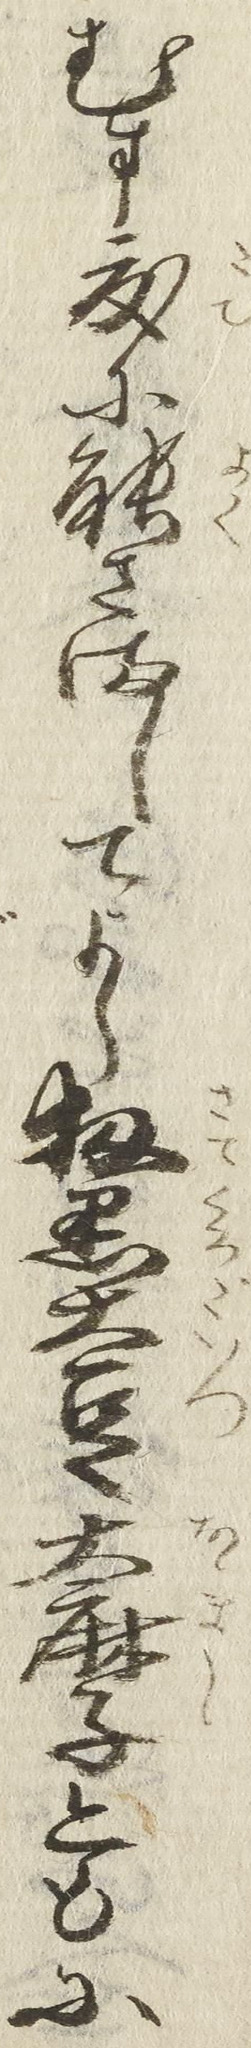むす度に能さましてよし扨黒大豆大麻子ともに
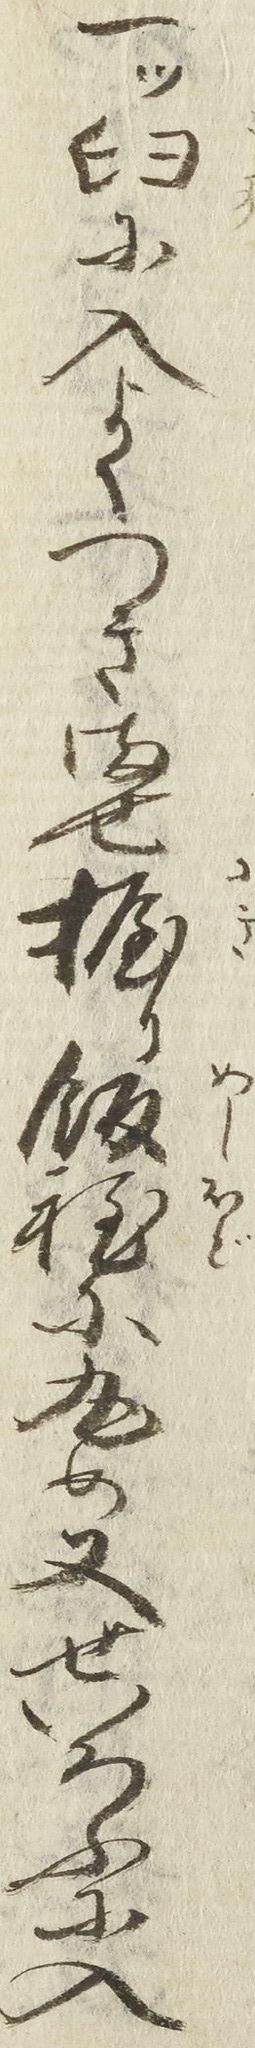一ツ臼に入よくつきませ握り飯程に丸め又せいろふに入
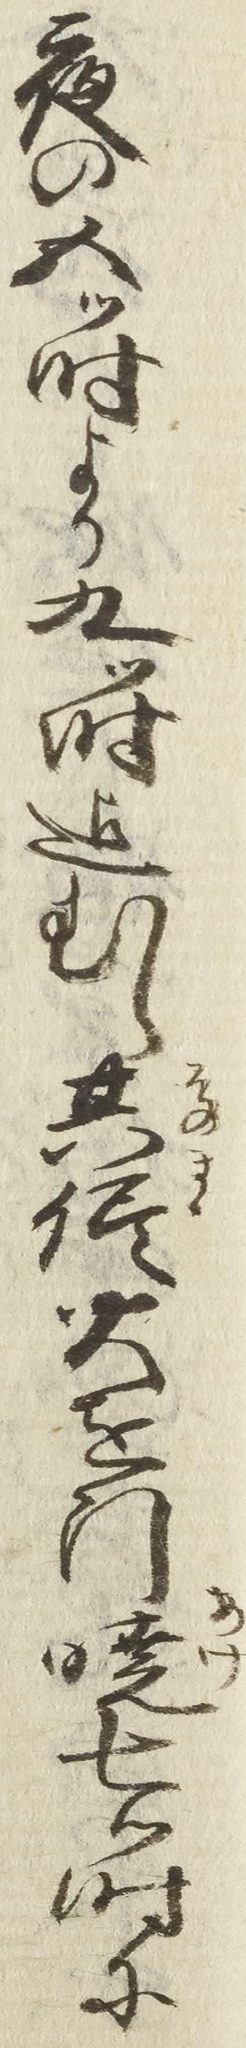夜の五ツ時より九ツ時迄むし其侭火を引暁七ツ時に
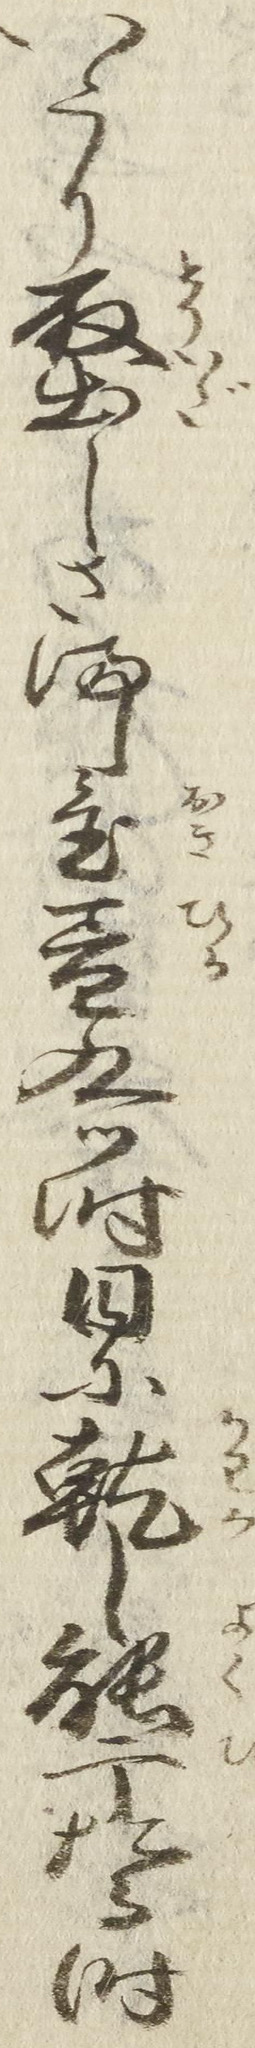いたり取出しさまし置昼九ツ時日に乾し能干たる時
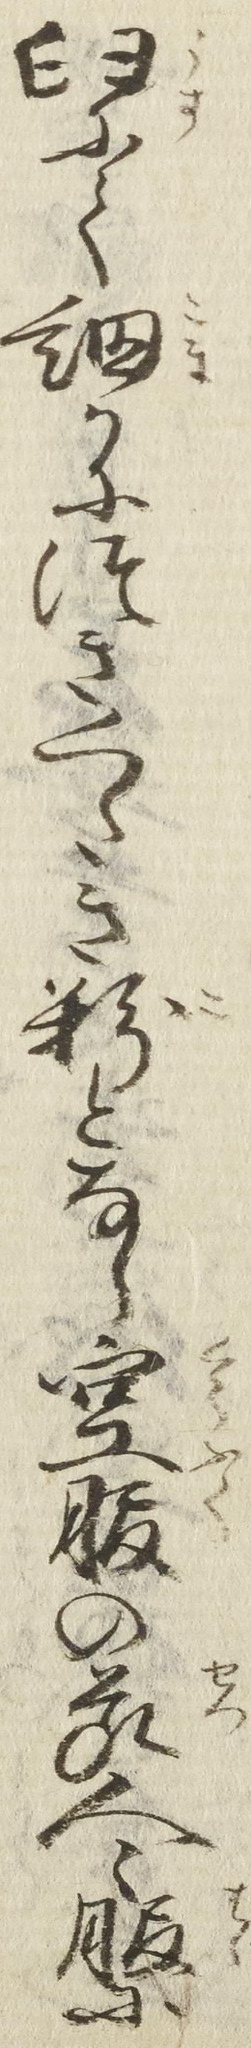臼にて細かにつきくたき粉となし空腹の節人〻腹に
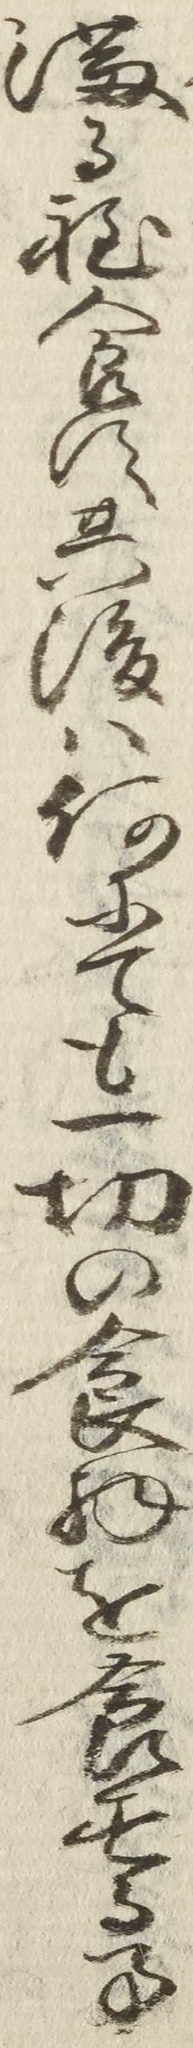満る程食す其後は何にても一切の食物を食する事
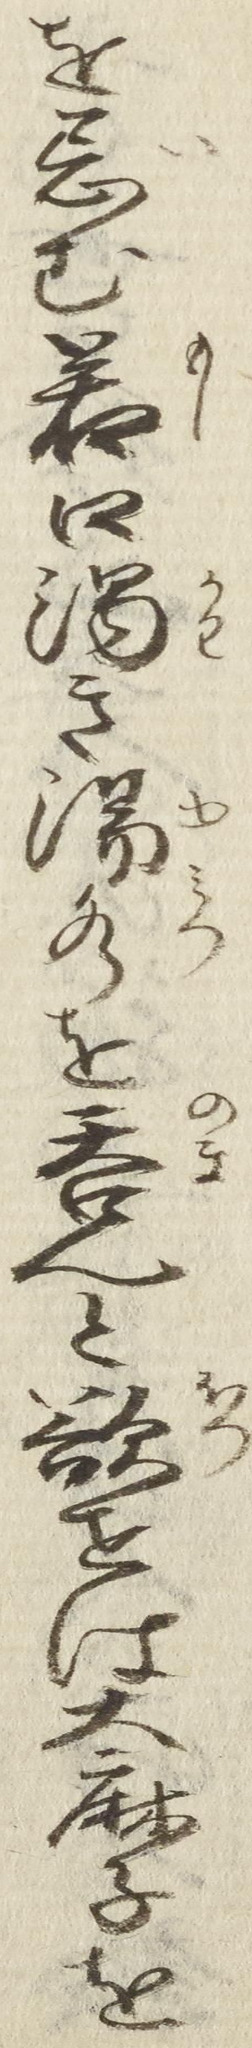を忌む若口渇き湯水を呑んと欲せは大麻子を
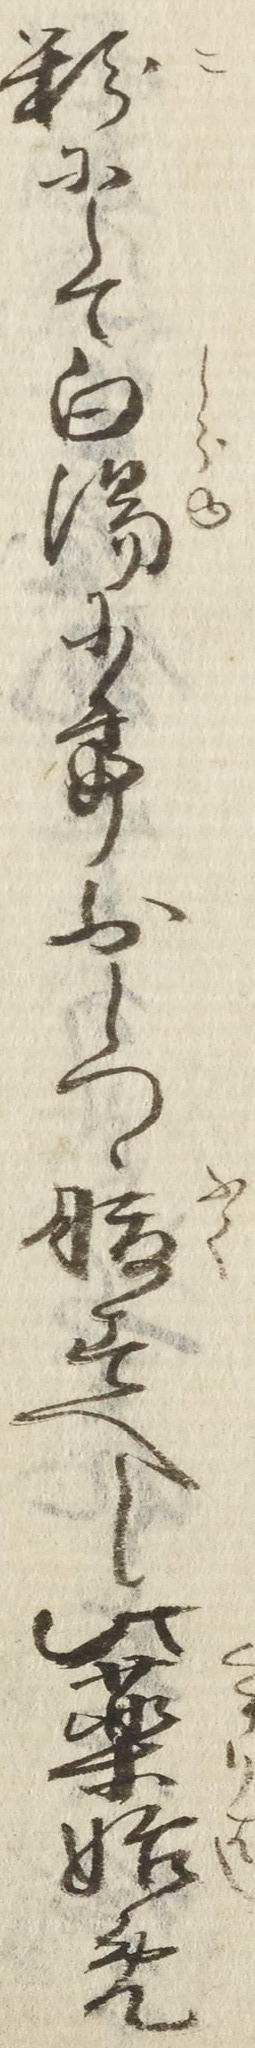粉にして白湯にて少しつゝ服すへし此薬始め
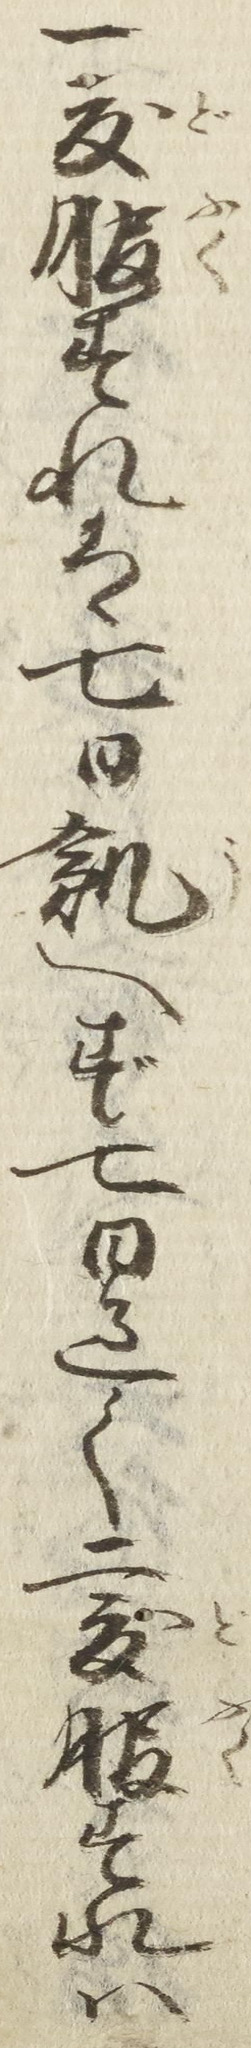一度服すれは七日飢へず七日過て二度服すれは
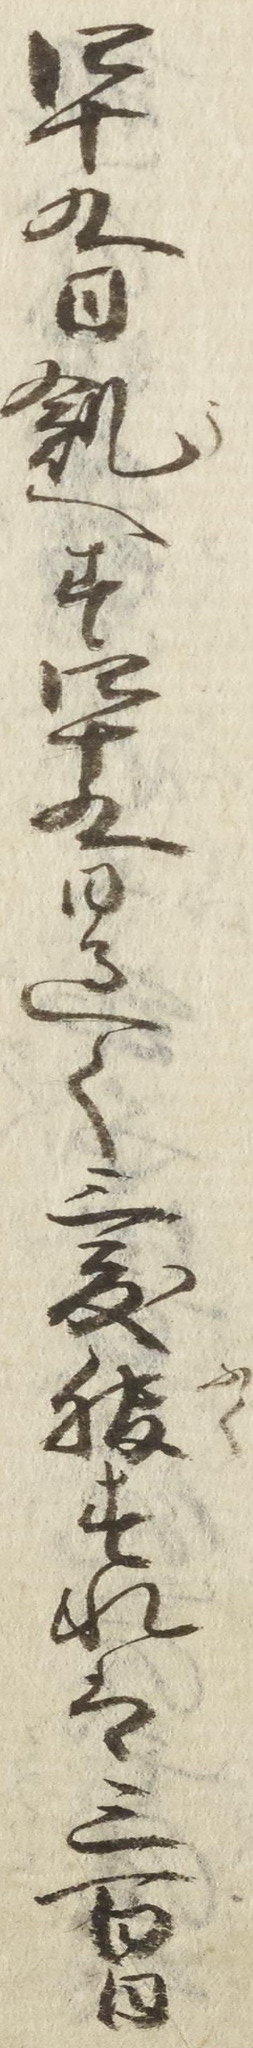四十九日飢へす四十九日過て三度服すれは三百日

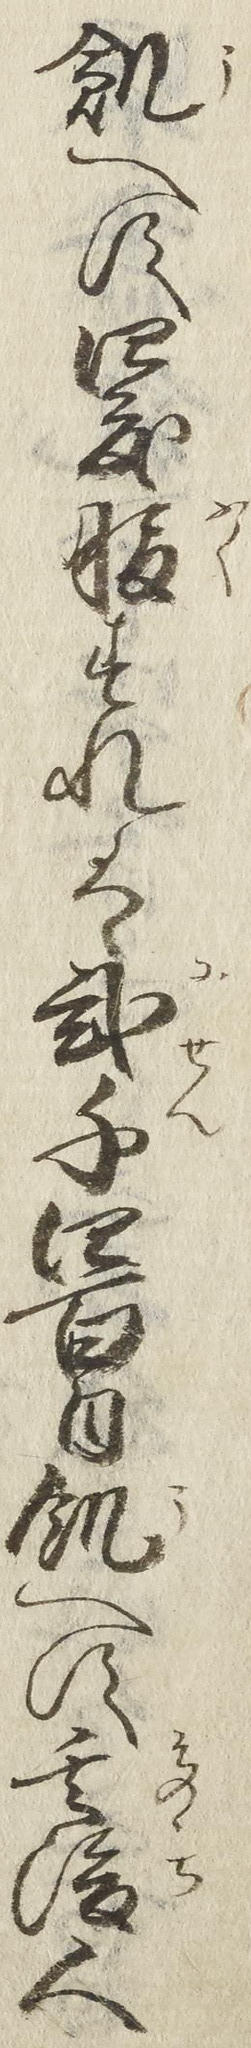飢へす四度服すれは弐千四百日飢へす其後人
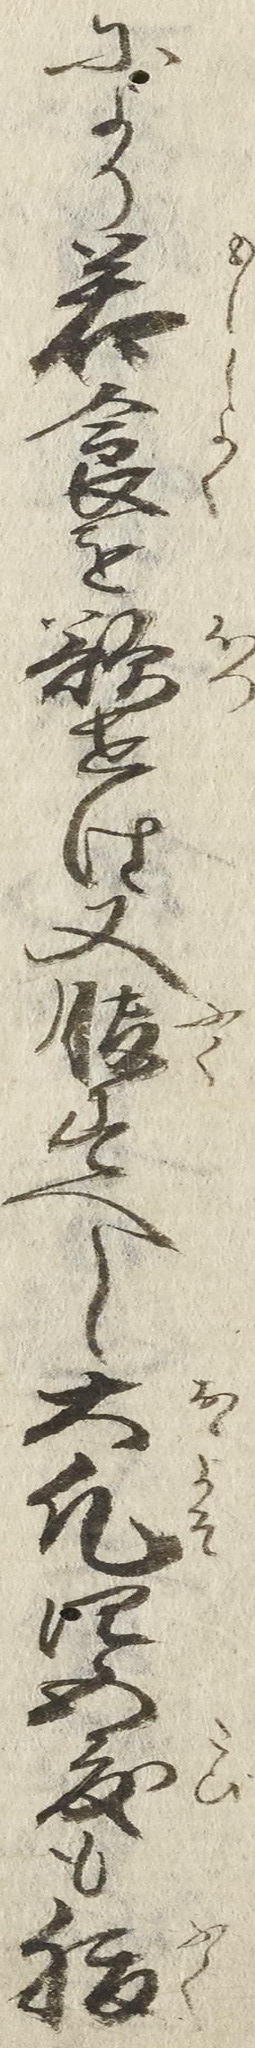により若食を欲せは又服すへし大凡四五度も服
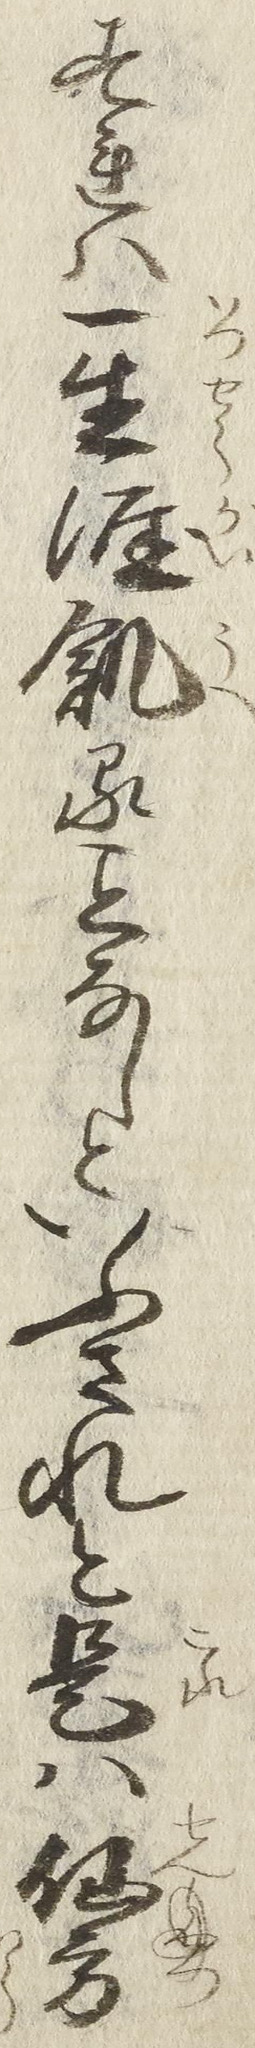すれは一生涯飢ることなしといふされと是は仙方
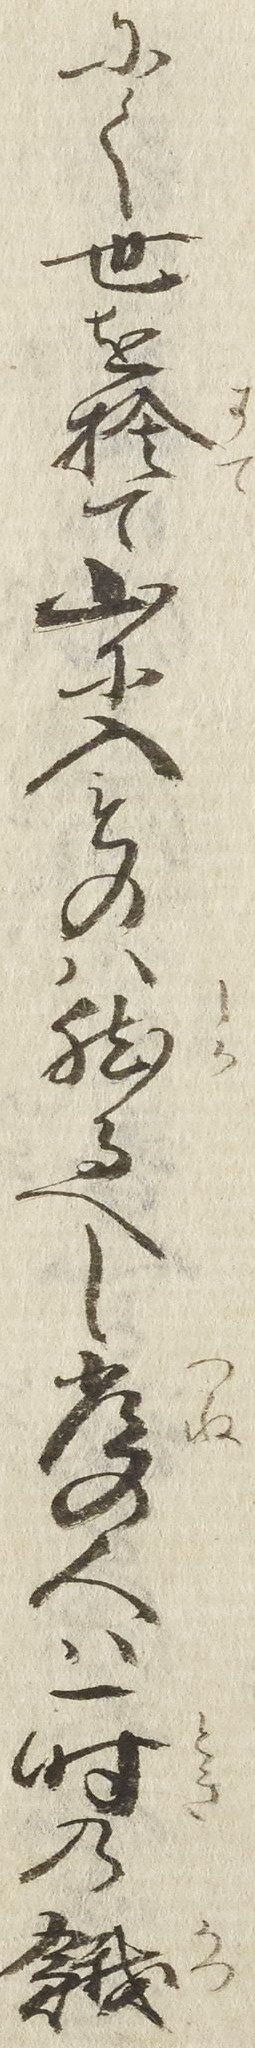にて世を捨て山に入ものは然るべし常の人は一時の餓
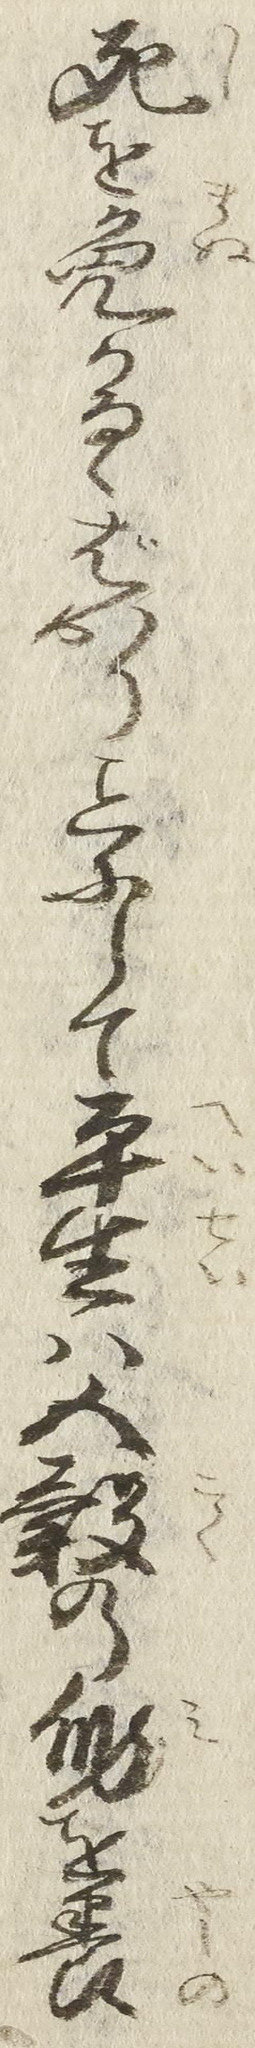死を免かるゝばかりことにして平生は五穀の身を養
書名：天明奇畧　全
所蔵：東京大学地震研究所図書室 Earthquake Research Institute Library, The University of Tokyo, JAPAN
